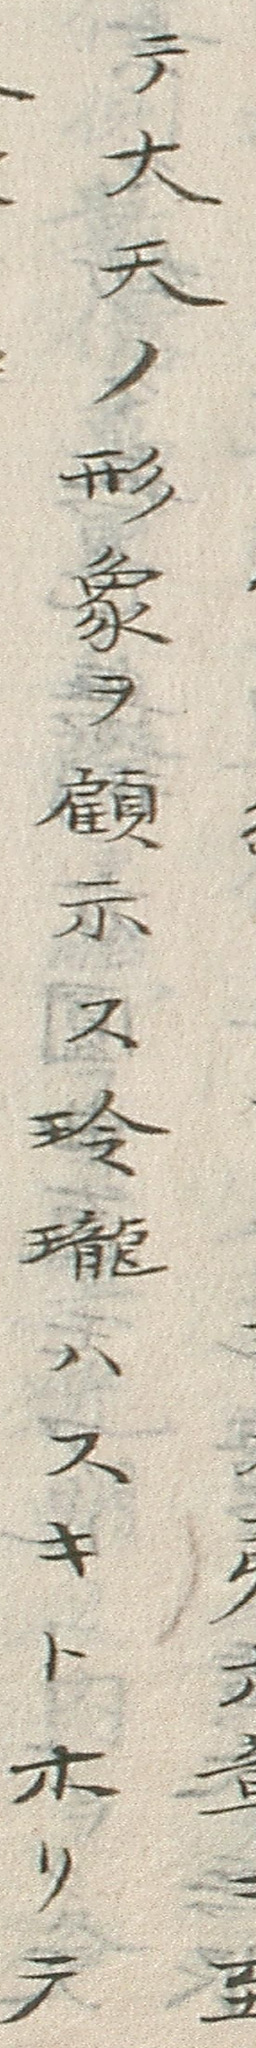テ大天ノ形象ヲ顧示ス玲瓏ハスキトホリテ
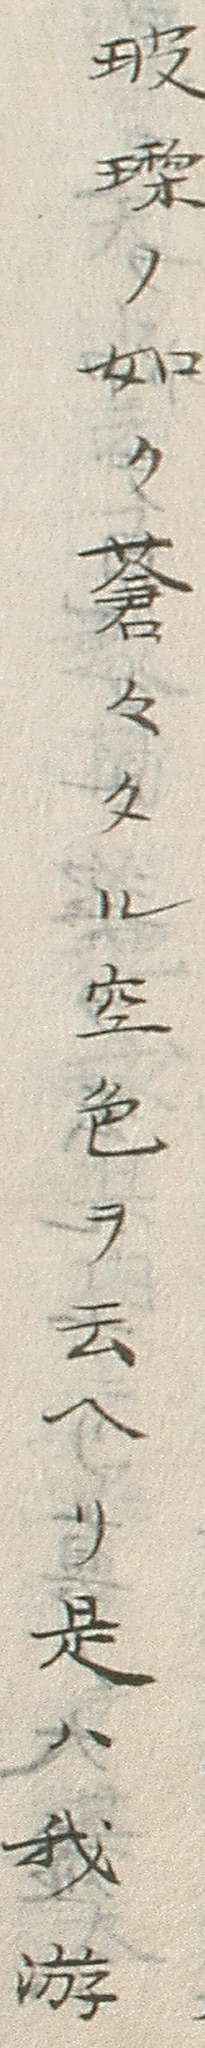玻瓈ノ如ク蒼々タル空色ヲ云ヘリ是ハ我游

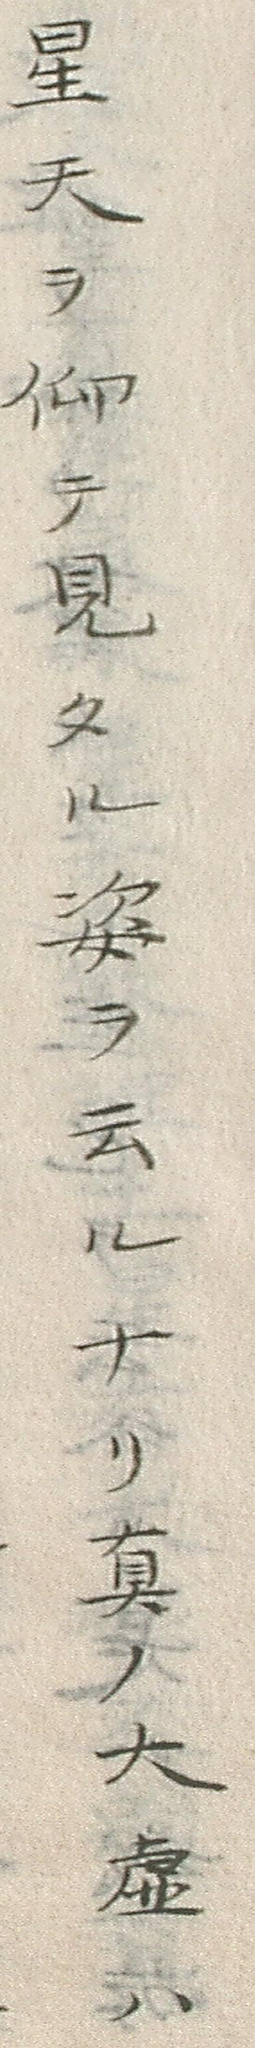星天ヲ仰テ見タル姿ヲ云ルナリ真ノ大虚ハ
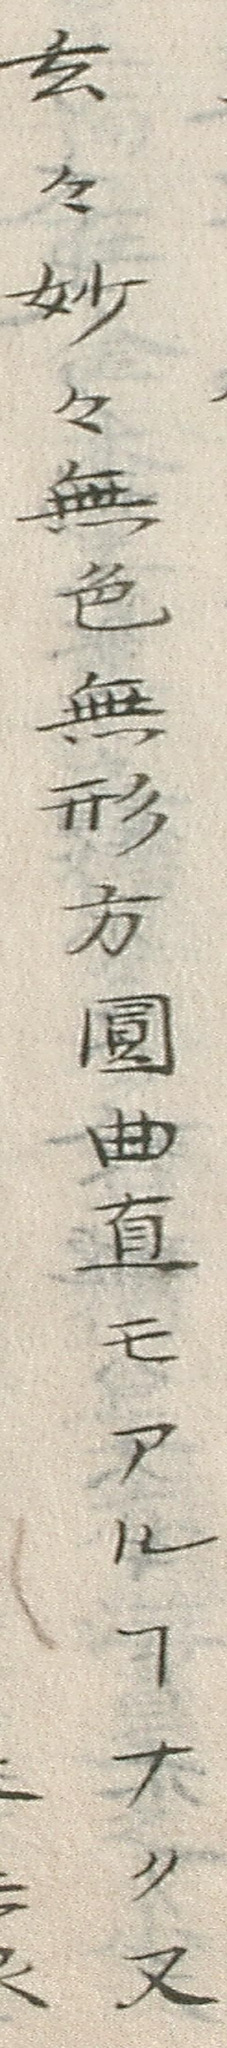玄々妙々無色無形方円曲直モアルコトナク又
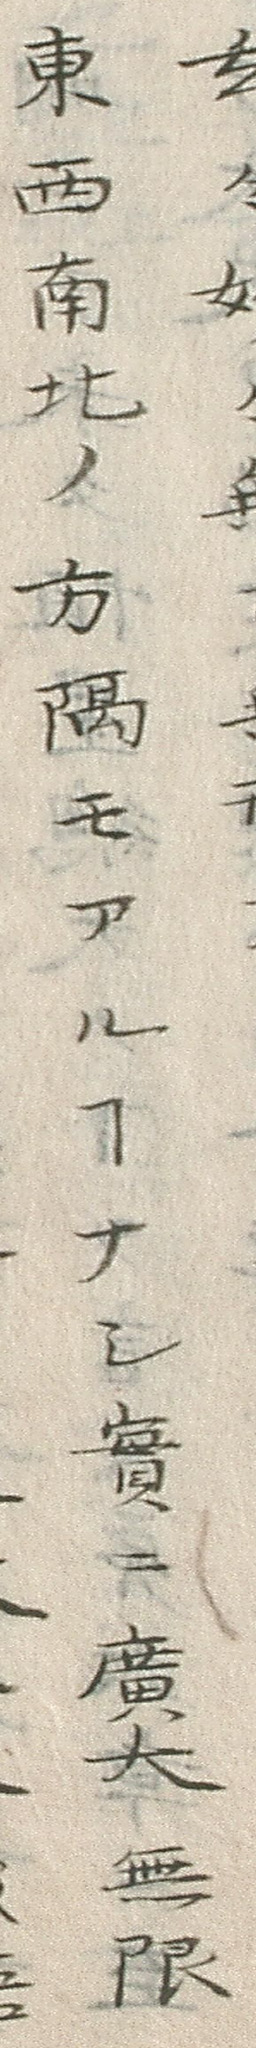東西南北ノ方隅モアルコトナシ実ニ広大無限
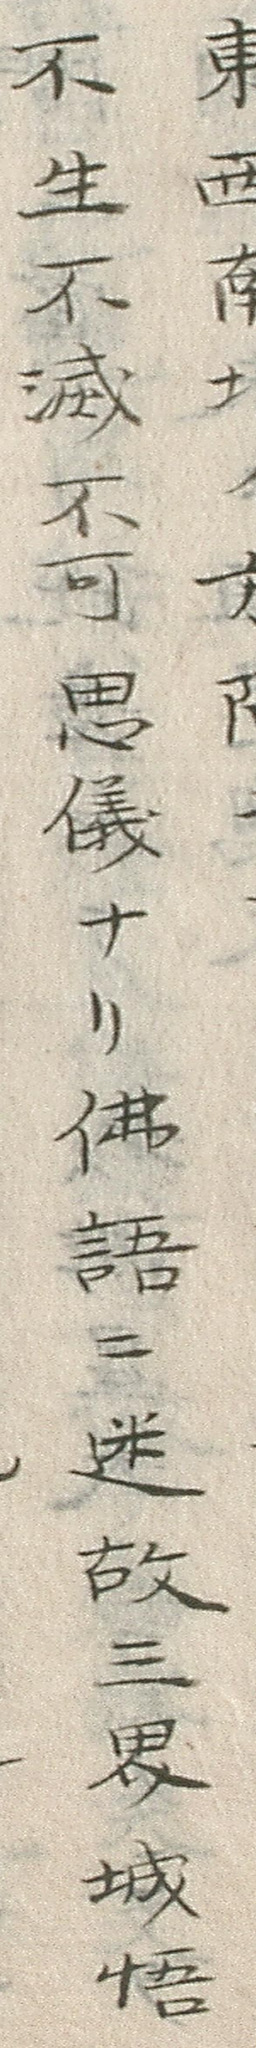不生不滅不可思儀ナリ仏語ニ迷故三界城悟
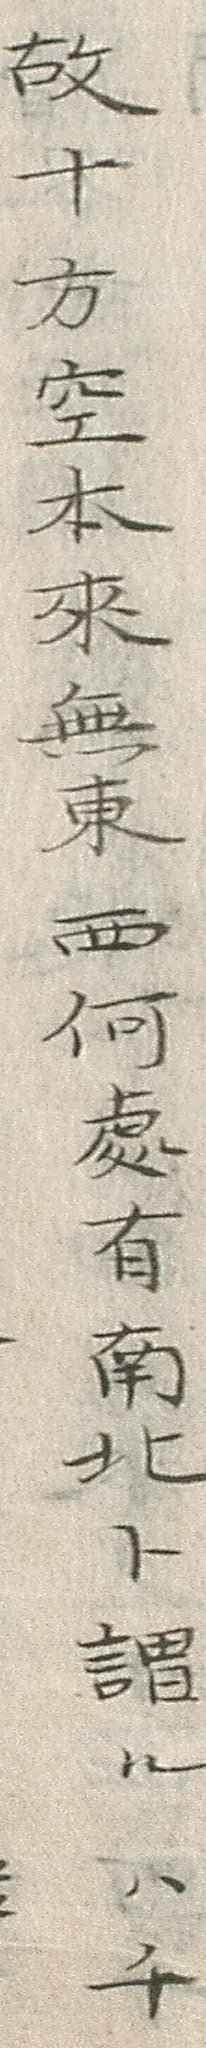故十方空本来無東西何処有南北ト謂ルハ千
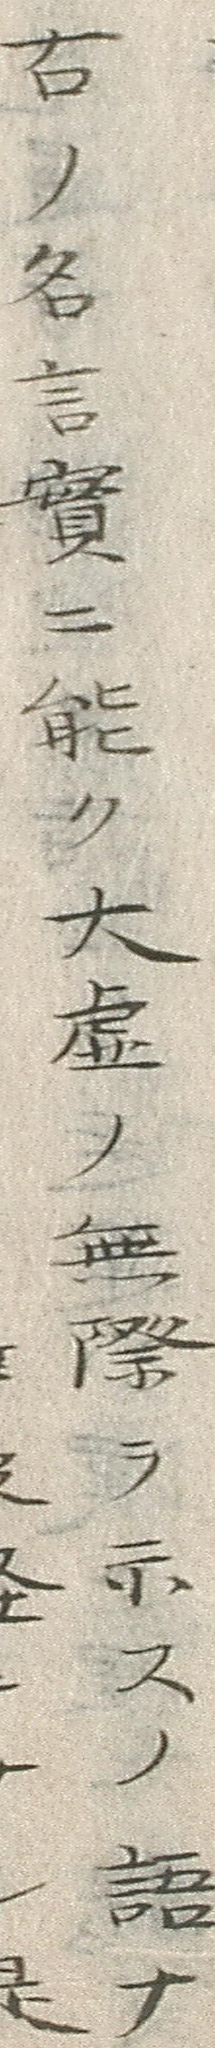古ノ名言実ニ能ク大虚ノ無際ヲ示スノ語ナ
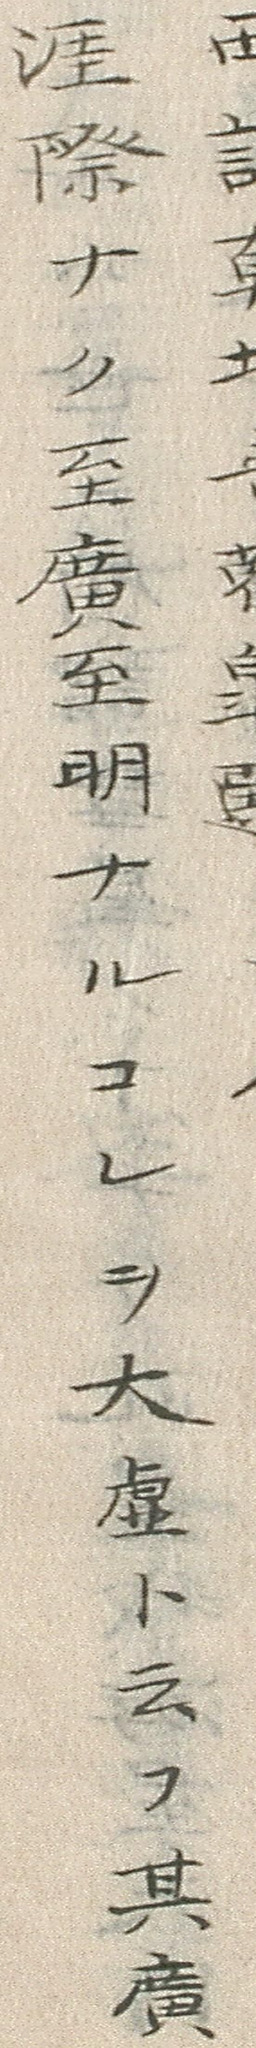涯際ナク至広至明ナルコレヲ大虚ト云フ其広
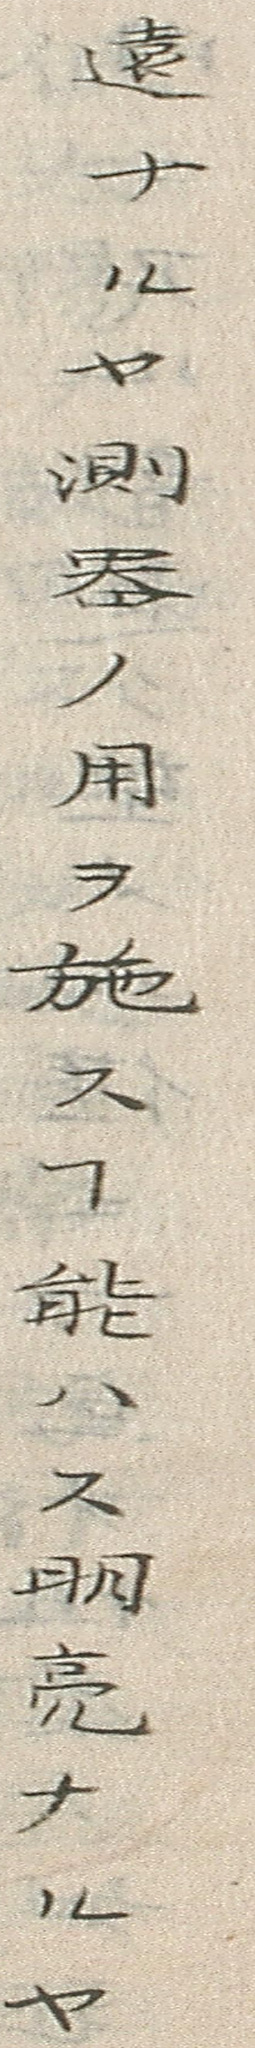遠ナルヤ測器ノ用ヲ施スコト能ハス明亮ナルヤ
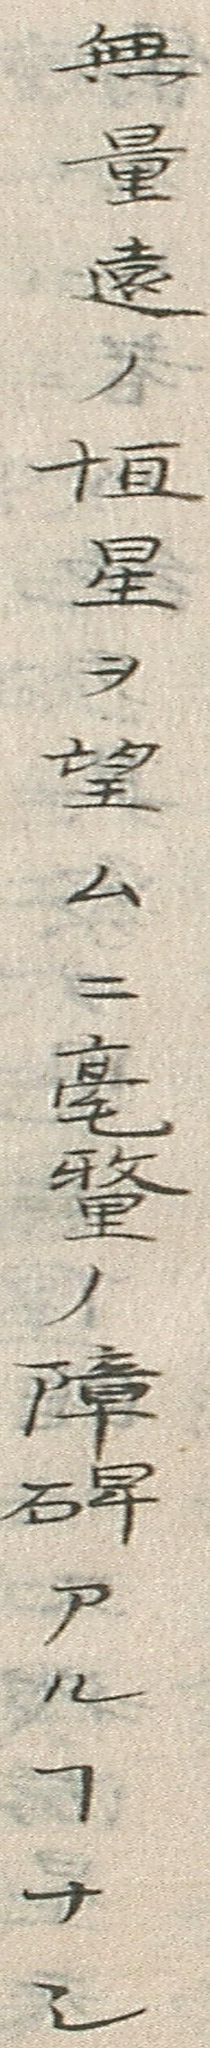無量遠ノ恒星ヲ望ムニ毫釐ノ障碍アルコトナシ
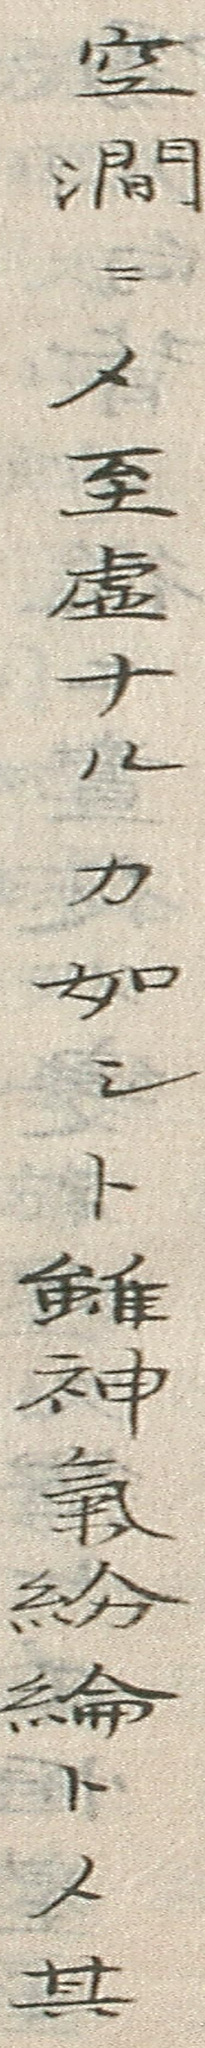空潤ニシテ至虚ナルカ如シト雖神気紛論トシテ其
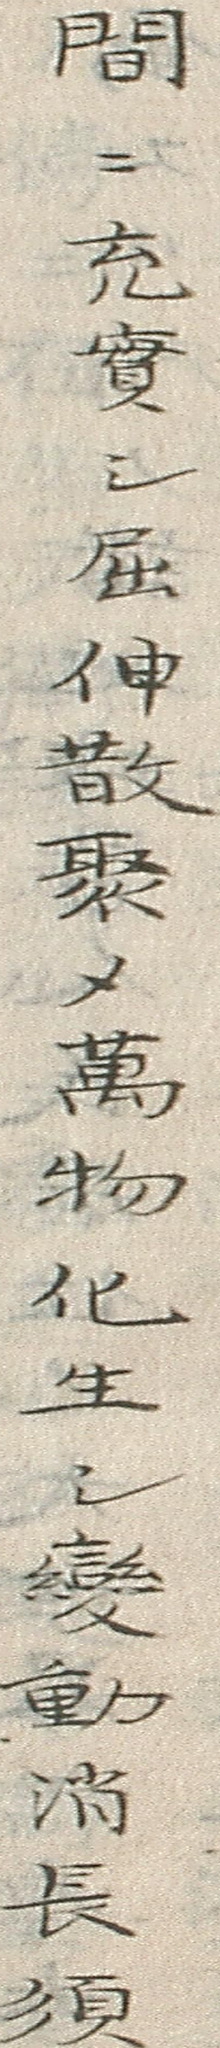間ニ充実シ屈伸散聚シテ万物化生シ変動消長須
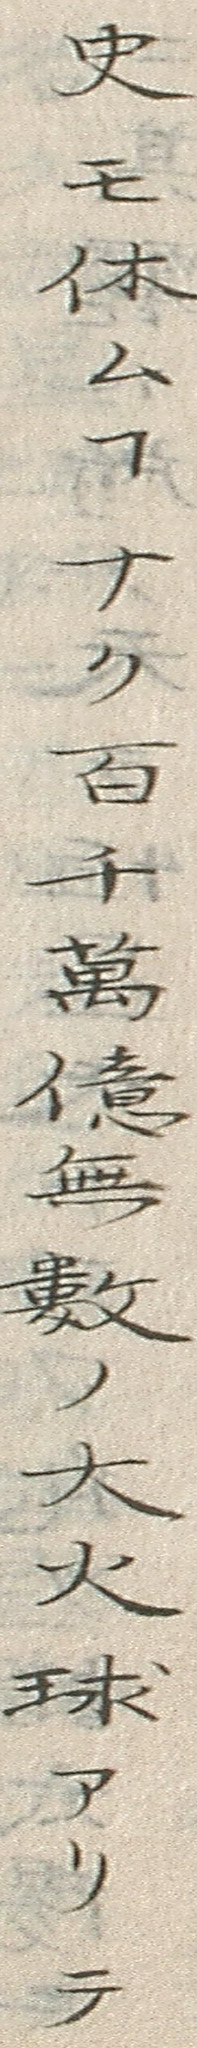史モ休ムコトナク百十万億無数ノ大火球アリテ
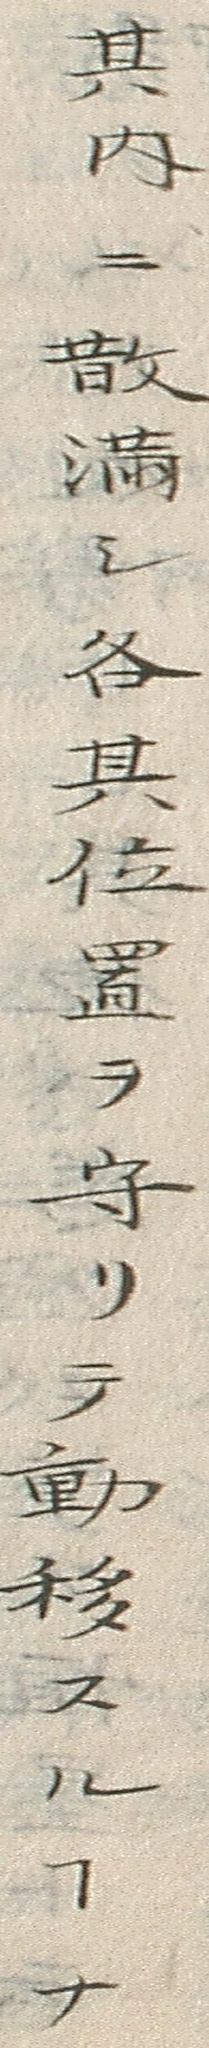其内ニ散満シ各其位置ヲ守リテ動移スルコトナ
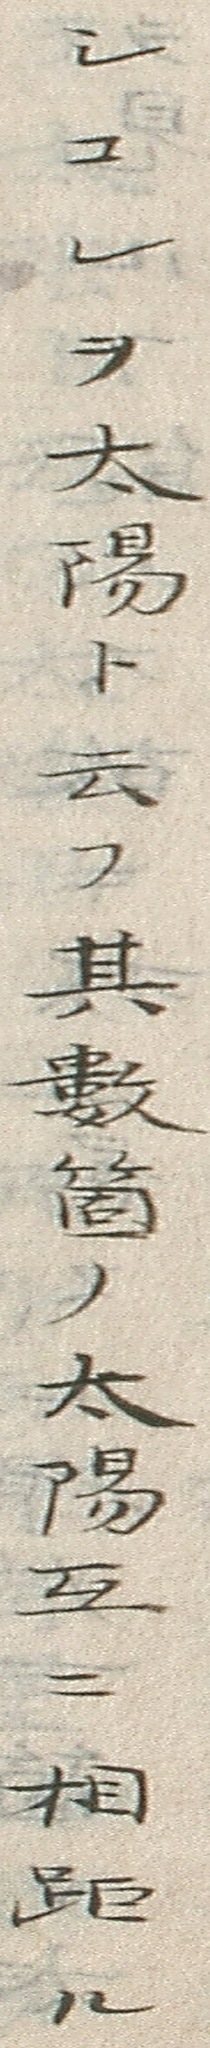シコレヲ太陽ト云フ其数箇ノ太陽互ニ相距ル
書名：天學略名目羽翼　全
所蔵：東京大学地震研究所図書室 Earthquake Research Institute Library, The University of Tokyo, JAPAN
